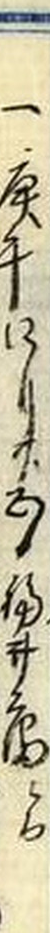一庚午四月廿五日福井藩ニ而
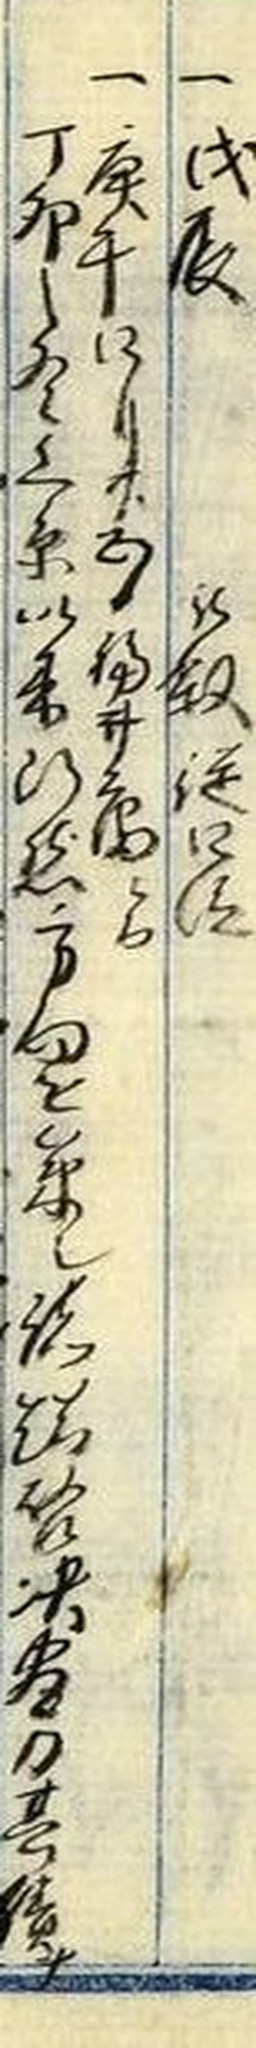丁卯之冬上京以来断然方向を策シ諸端替決尽力其績ヲ
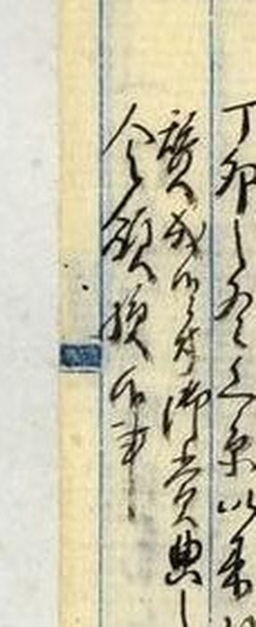金領換候事
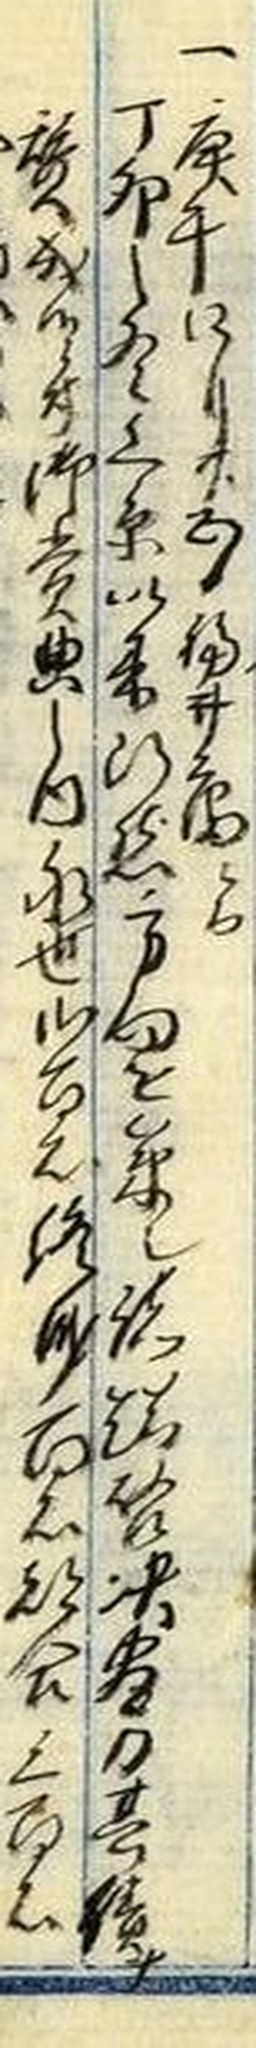賛成候付御賞典之内永世弐百石終身百石都合三百石

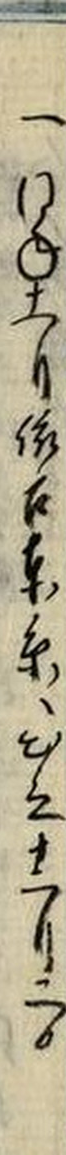一同年十一月依召東京へ出立十二月二日
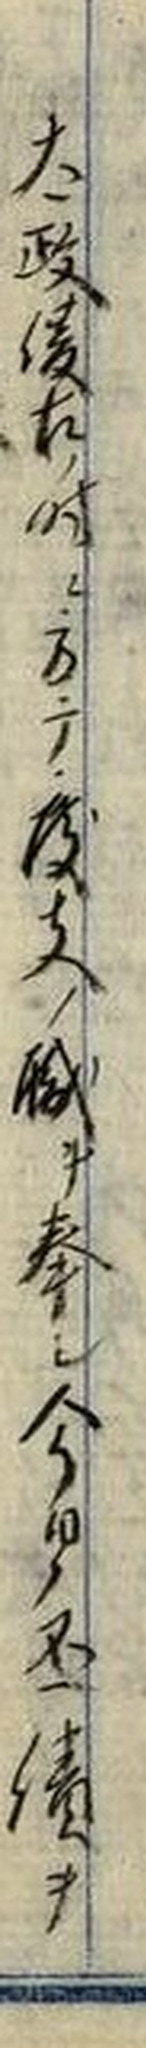太政復古ノ時ニ方テ度支ノ職ヲ奉シ今日ノ丕債ヲ
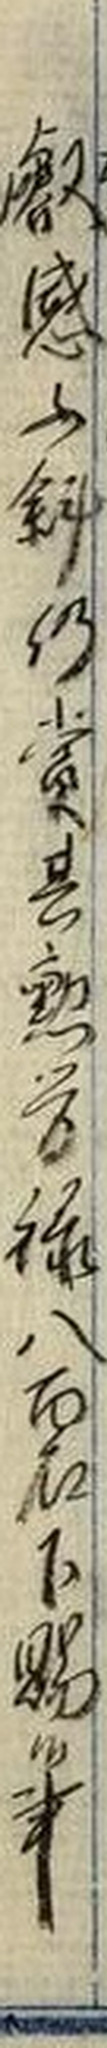叡感不斜仍賞其勲労禄八百石下賜候事
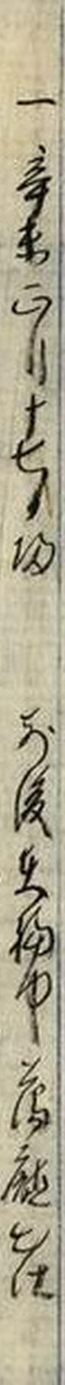一辛未正月十七日帰前後在福中藩庁出仕
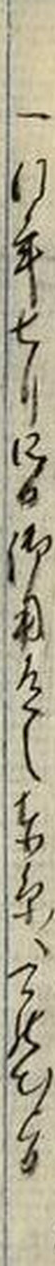一同年七月四日御用有之東京へ可罷出旨
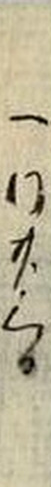一同廿三日
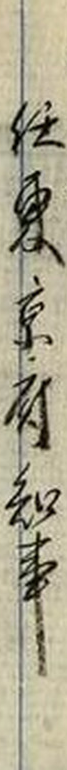任東京府知事
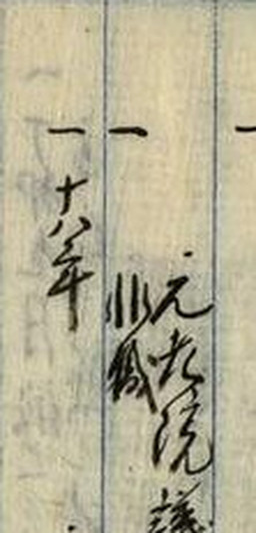一非職
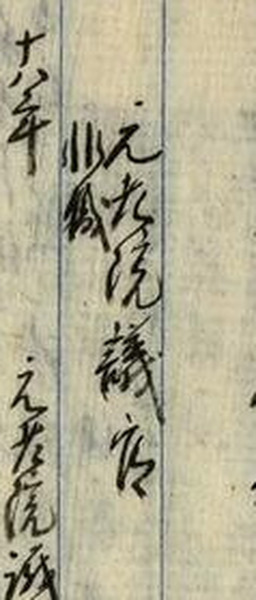元老院議官
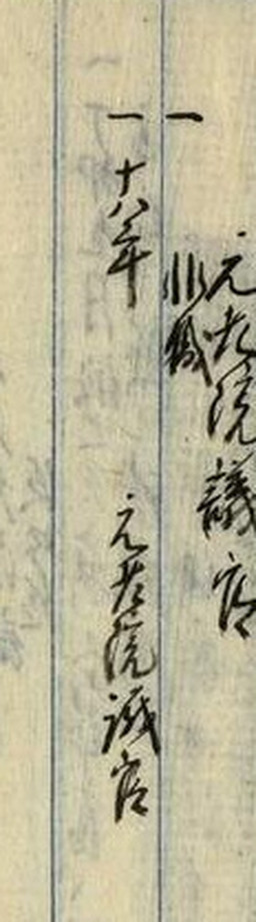一十八年元老院議官
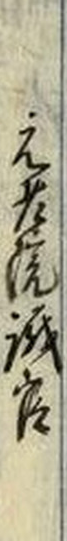元老院議官
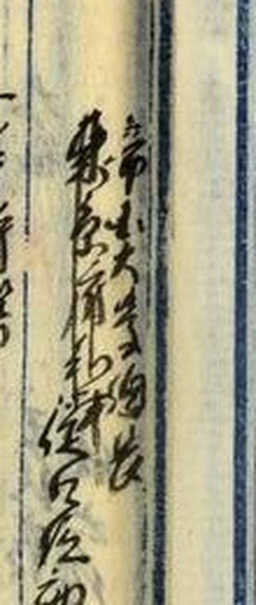帝国大学総長
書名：温古集 三巻
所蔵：福井県文書館 Fukui Prefectural Archives
